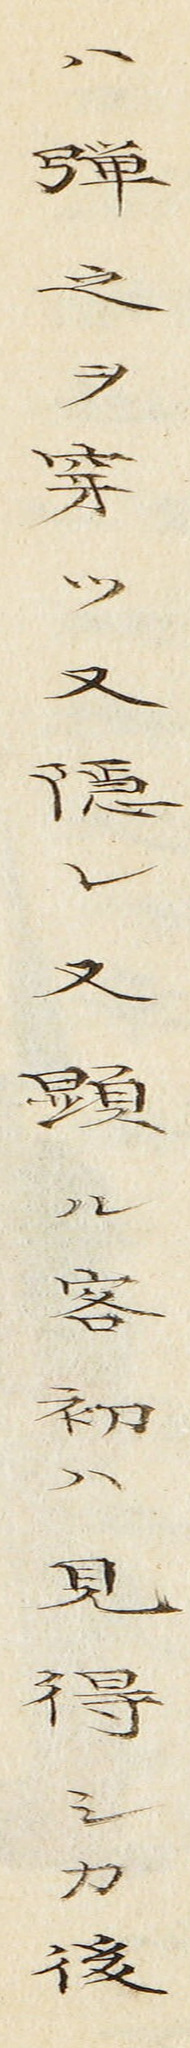ハ弾之ヲ穿ツ又隠レ又顕ル客初ハ見得シカ後
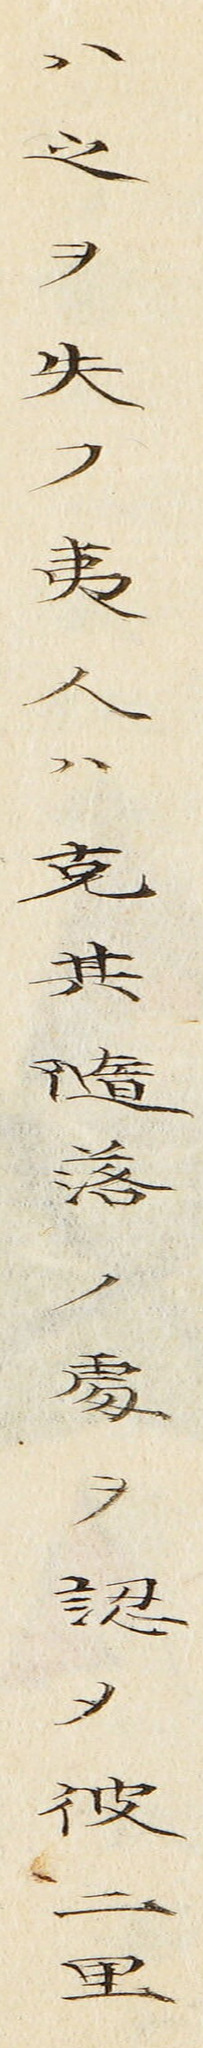ハ之ヲ失フ夷人ハ克其随落ノ処ヲ認メ彼二里
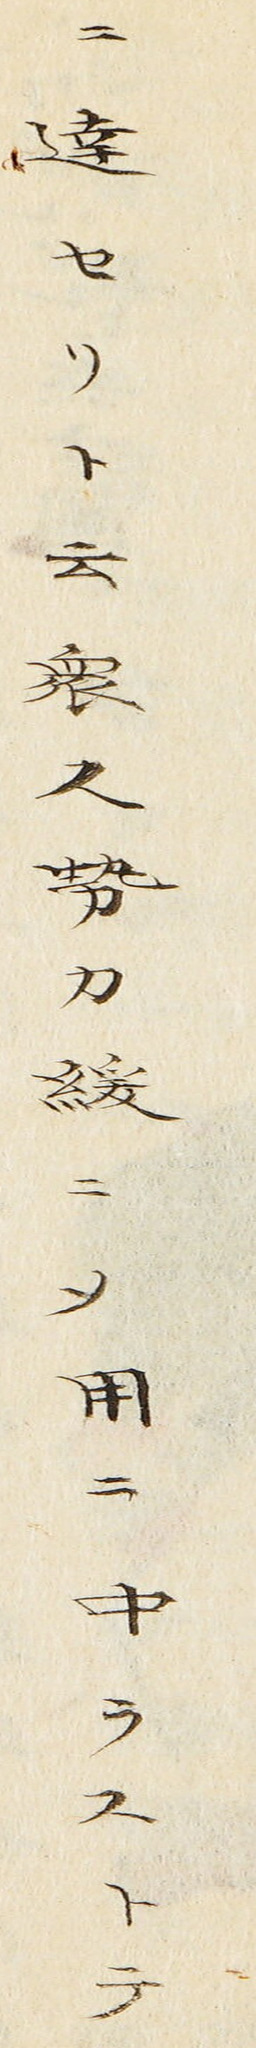ニ達セリト云衆人勢力緩ニシテ用ニ中ラストテ
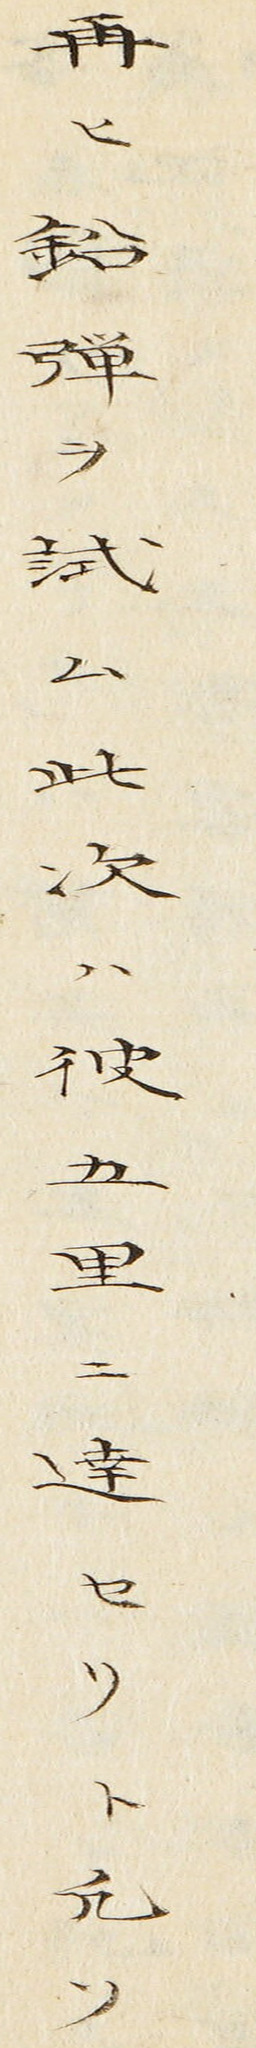再ヒ鉛弾ヲ試ム此次ハ彼五里ニ達セリト凡ソ
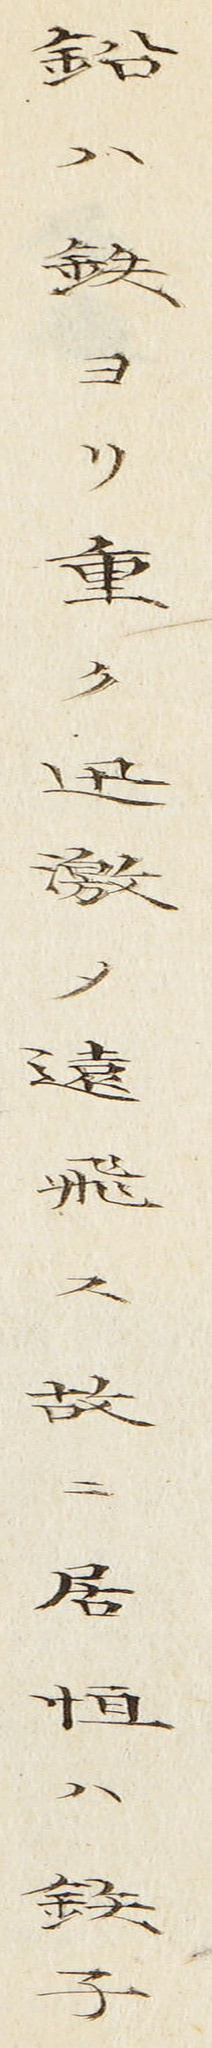鉛ハ鉄ヨリ重く迅激ノ遠飛ス故ニ居恒ハ鉄子
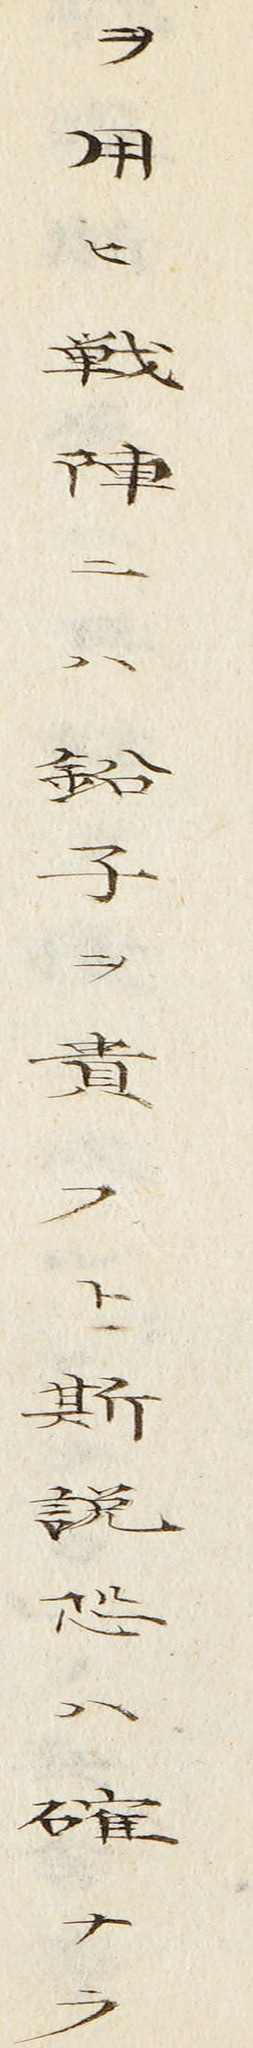ヲ用ヒ戦陣ニハ鉛子ヲ貴フト斯説恐ハ確ナラ
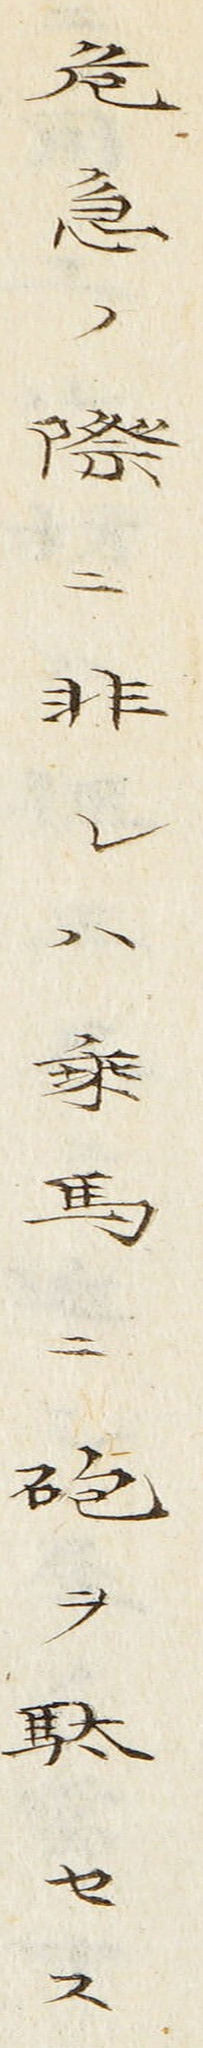〇危急ノ際ニ非レハ乗馬ニ砲ヲ駄セス
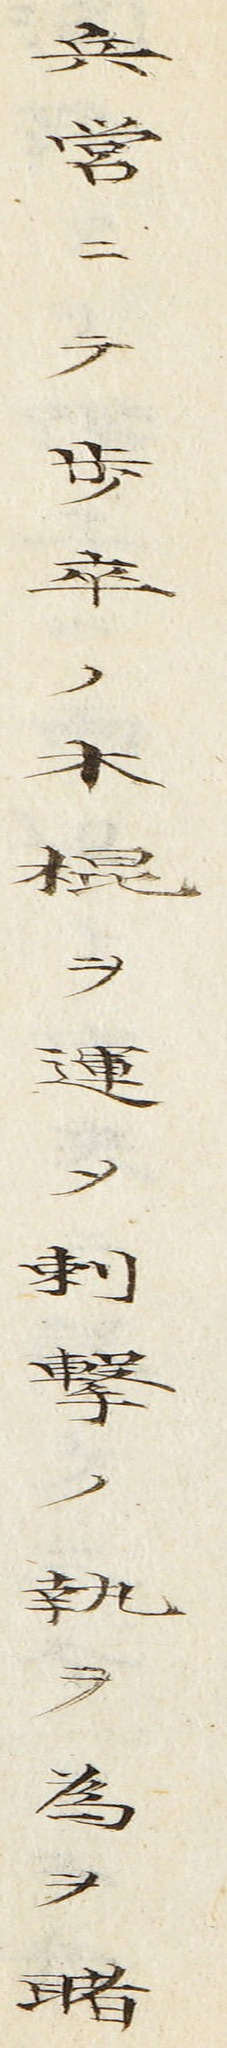〇兵営ニテ歩卒ノ木棍ヲ運シテ刺撃ノ執ヲ為ヲ睹
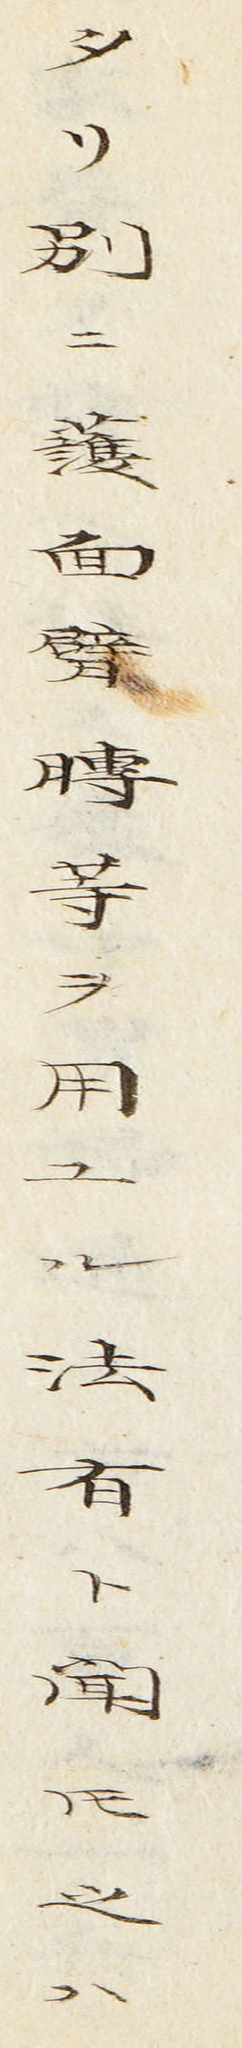タリ別ニ護面臂膞等ヲ用ユル法有ト聞トモ之ハ
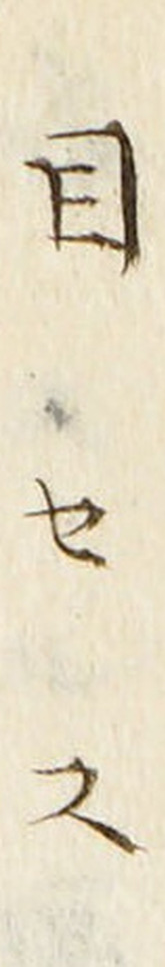目セス

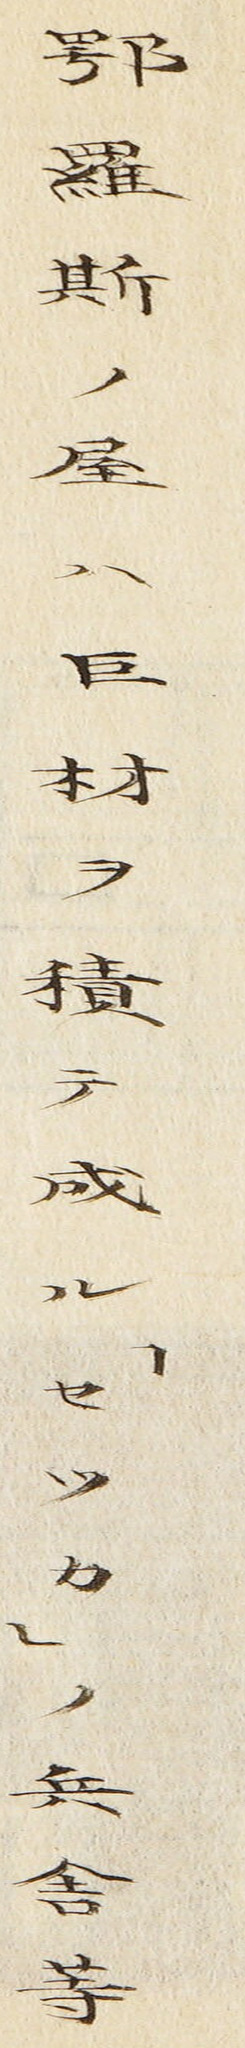〇鄂羅斯ノ屋ハ巨材ヲ積テ成ル「セツカ」の兵舎等
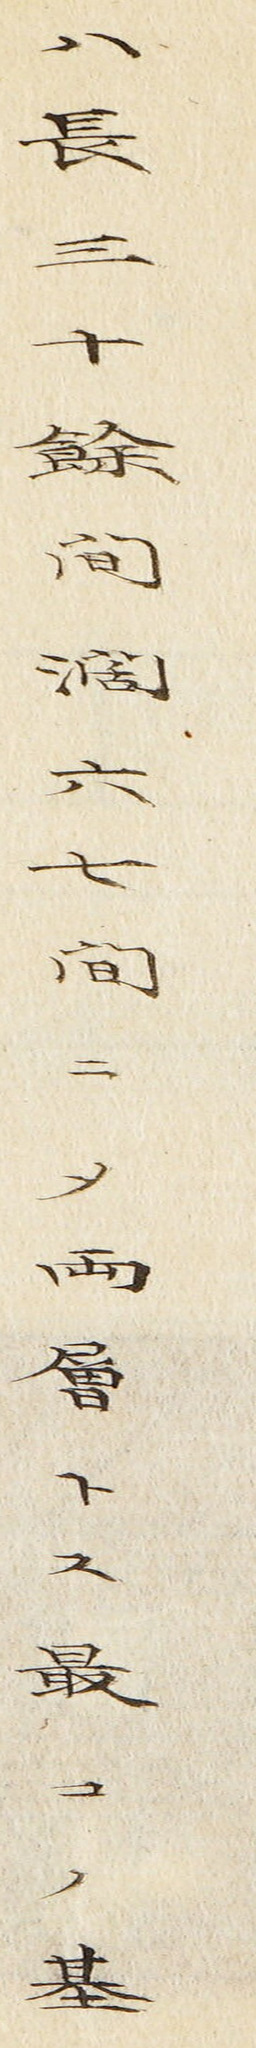ハ長三十余間濶六七間ニシテ両層トス最コノ基
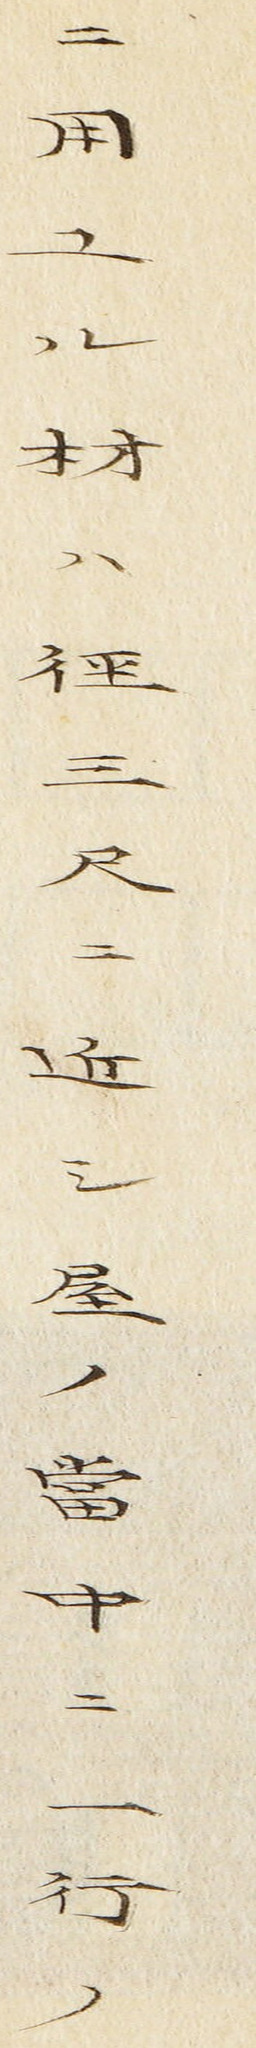ニ用ユル材ハ径三尺ニ近シ屋ノ当中ニ一行ノ
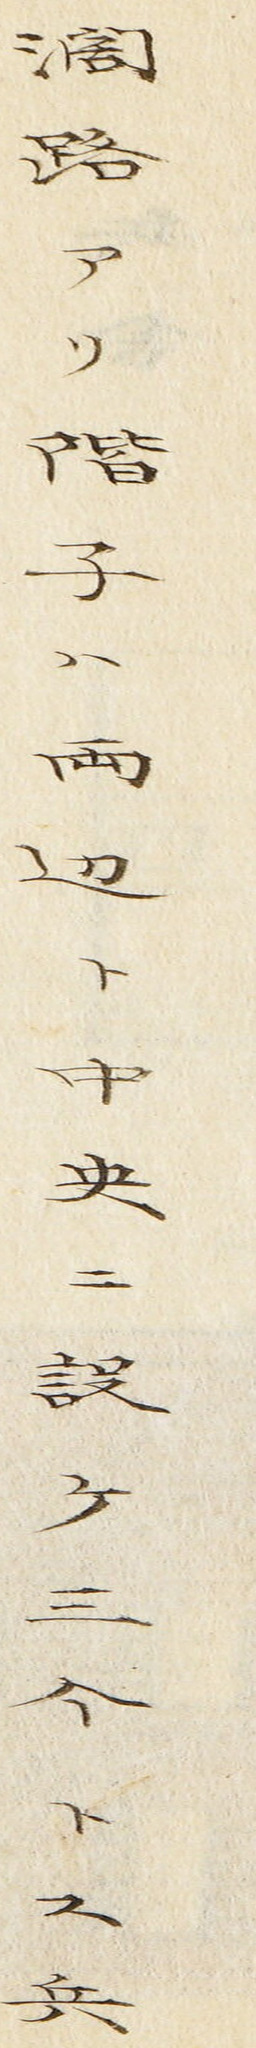濶路ありアリ階子ハ両辺ト中央ニ設ケ三个トス兵
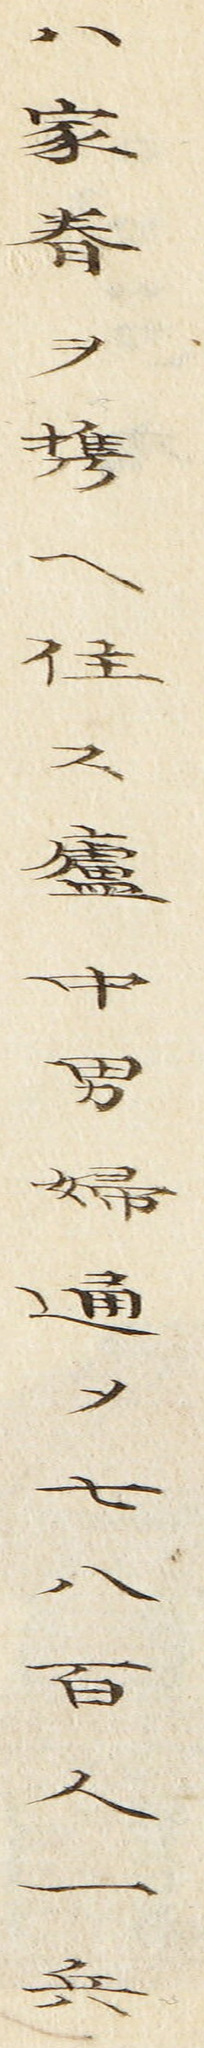ハ家眷ヲ携ヘ住ス盧中男婦通シテ七八百人一兵
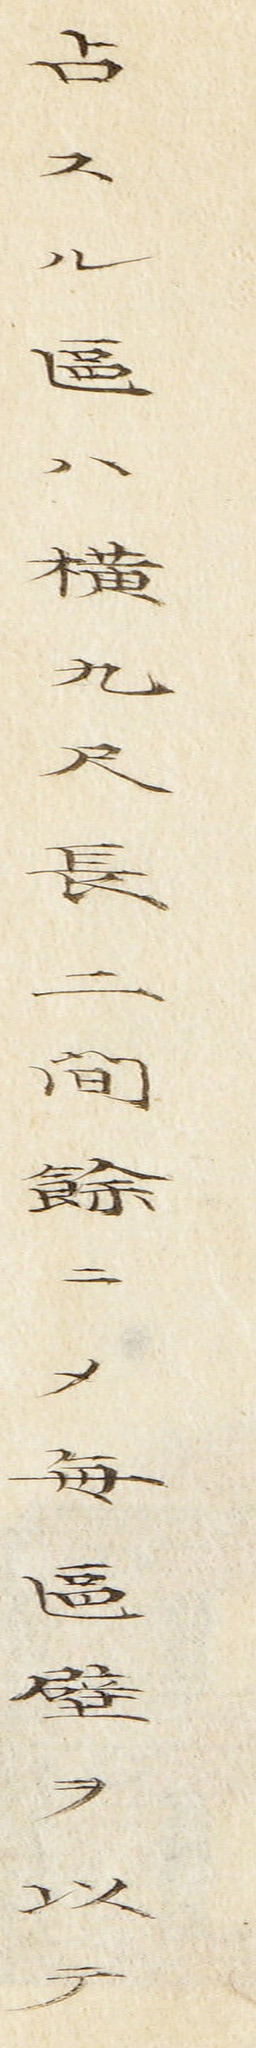占スル区ハ横九尺長二間余ニシテ毎区壁ヲ以テ
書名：蕃談
